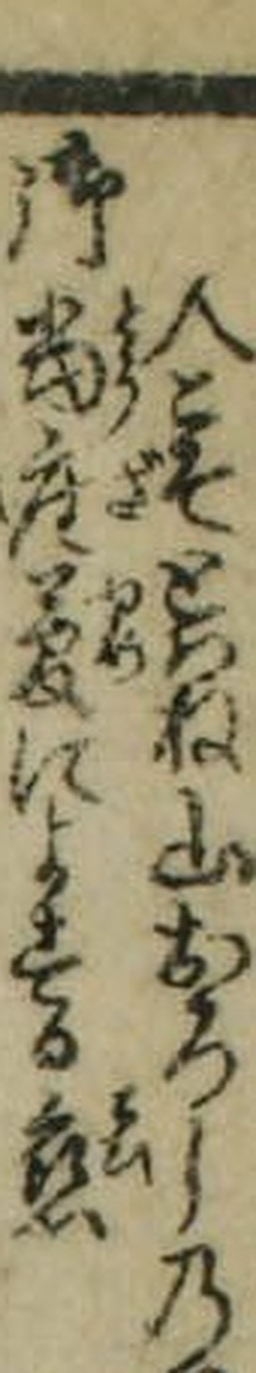御当座夢によする恋
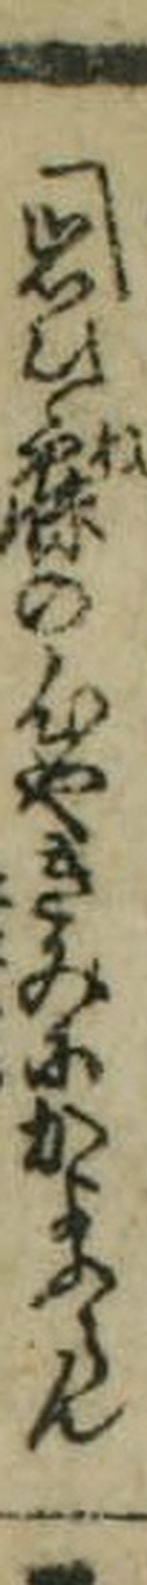「思ひ寝の心やきみにかよふらん
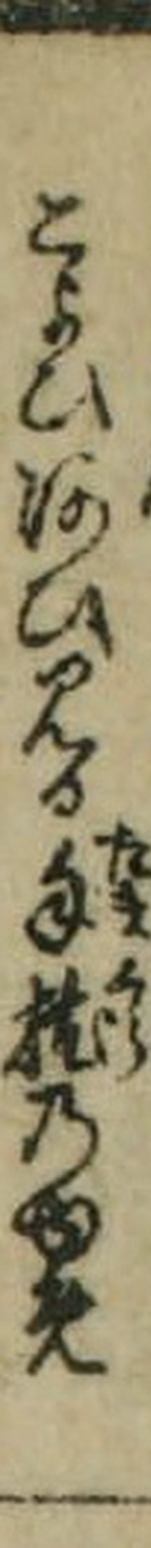こよひあひ見る手枕のゆめ
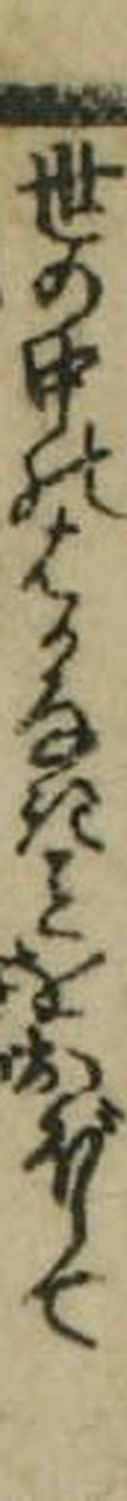世の中のはかなきををおぼして
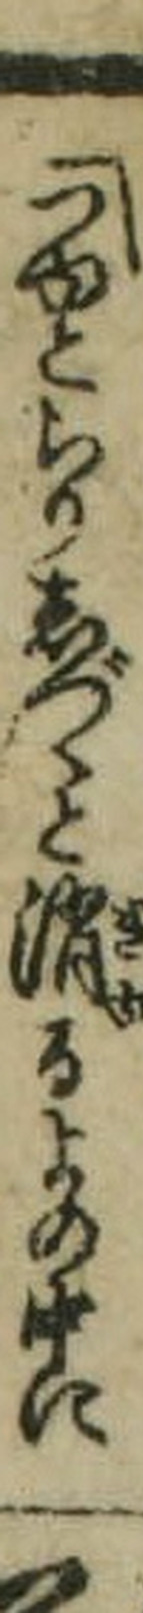「つゆとちりしづくと消るよの中に
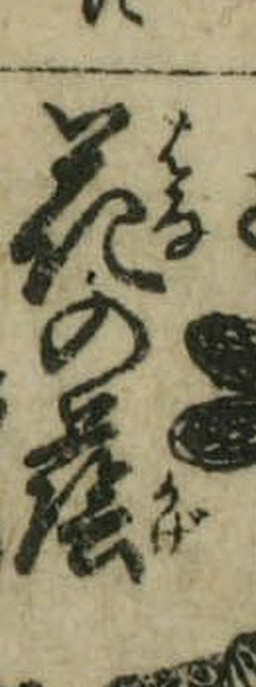花の蔭
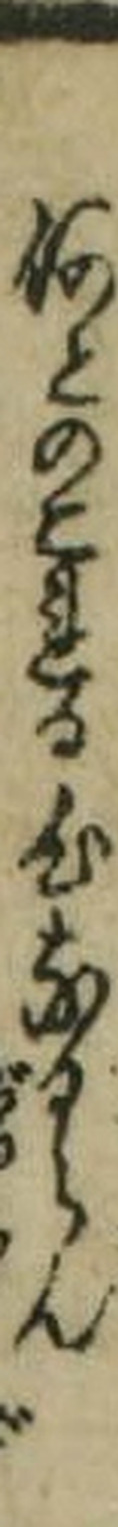何とのこれる心なるらん
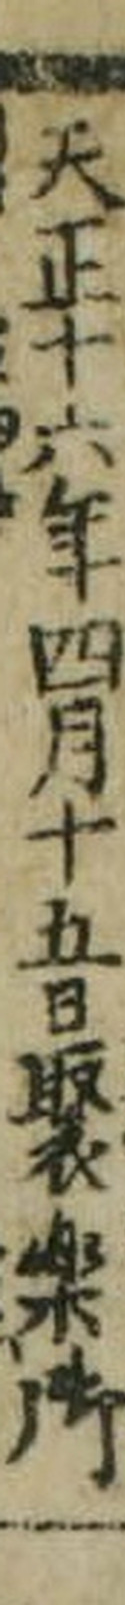天正十六年四月十五日聚楽御
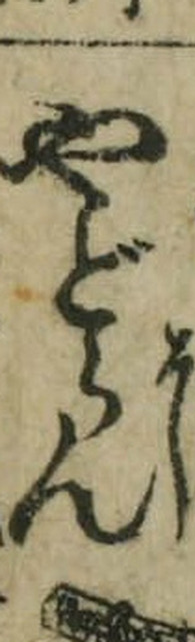やどらん
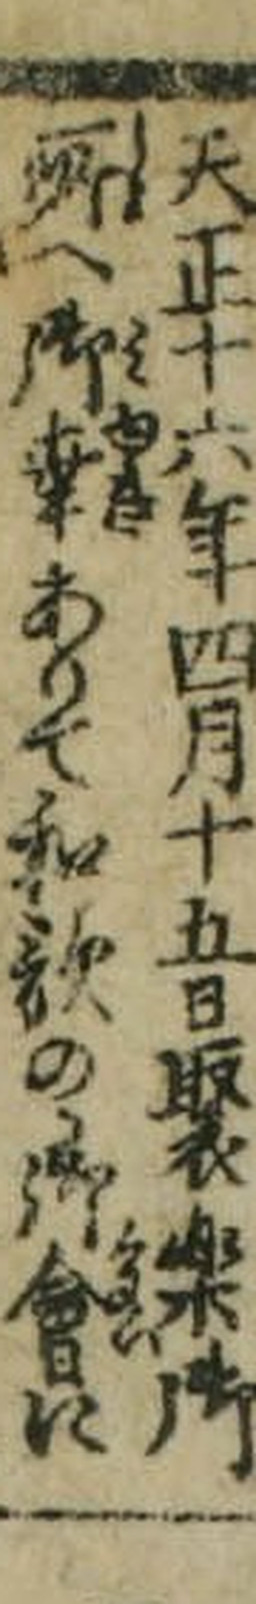所へ御幸ありて和歌の御會に
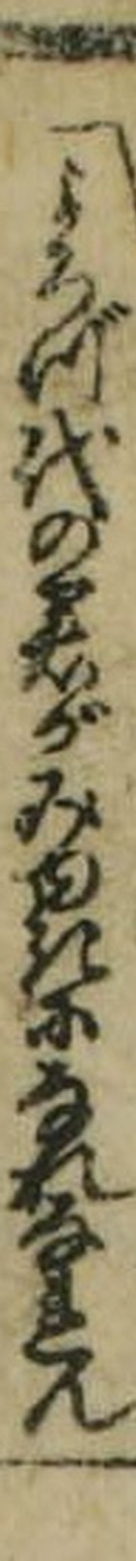「よろづ代の君がみゆきになれなれん
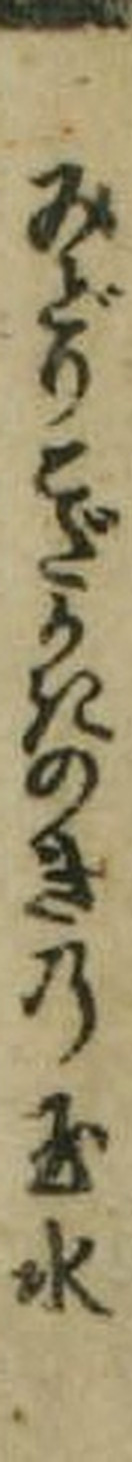みどりこだかきのきの玉水
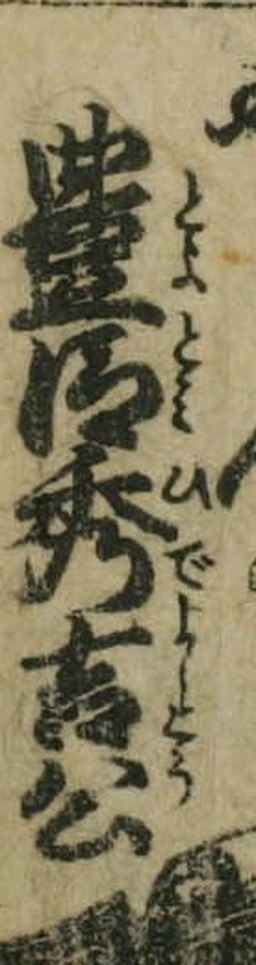豊臣秀吉公
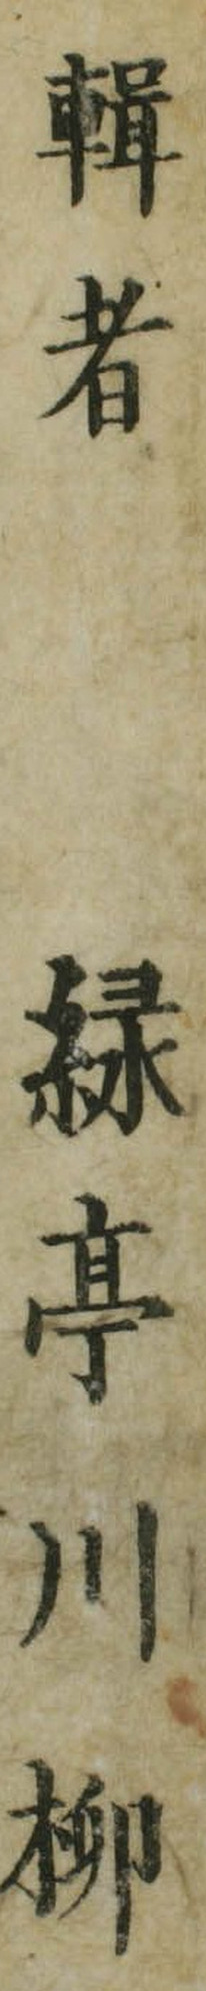輯者緑亭川柳

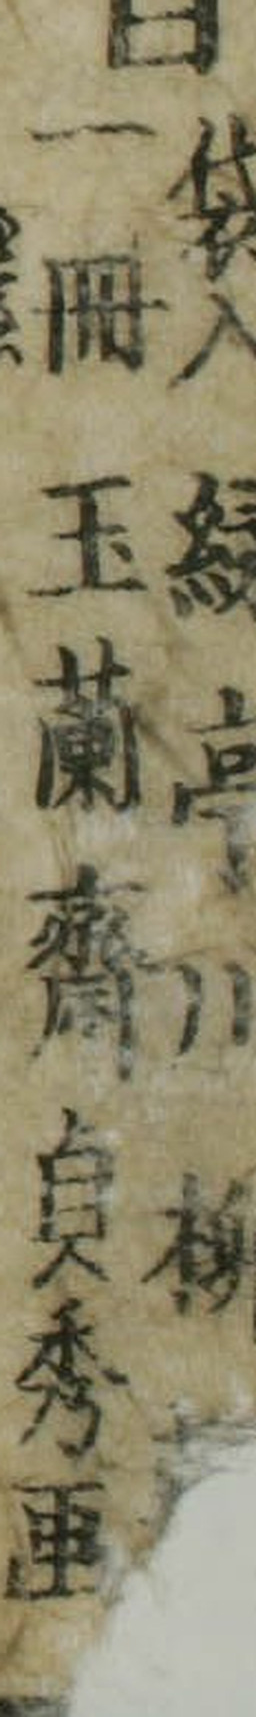一冊玉蘭齋貞秀画
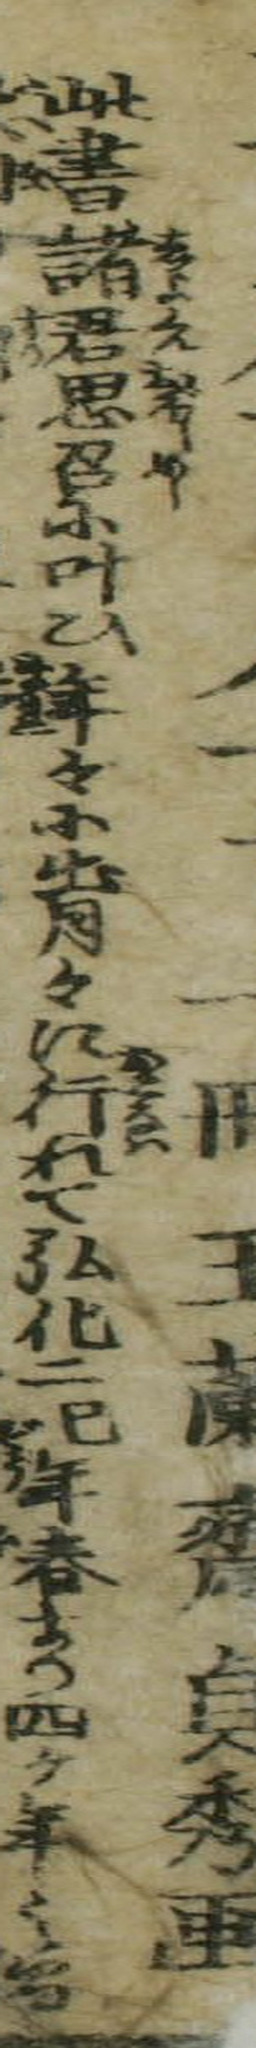此書諸君思召に叶ひ年々に出月々に行れて弘化二巳年春より四ヶ年の間
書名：續英雄百人一首
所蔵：東京学芸大学附属図書館
